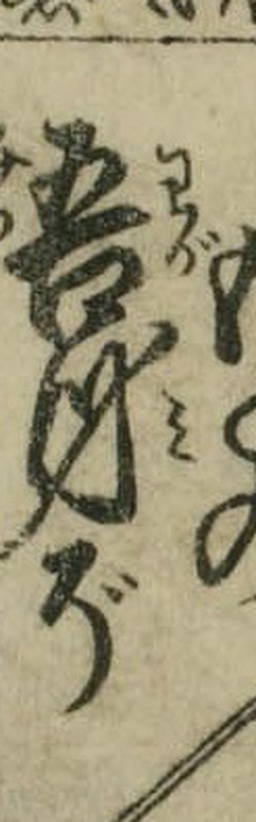吾身ぞ
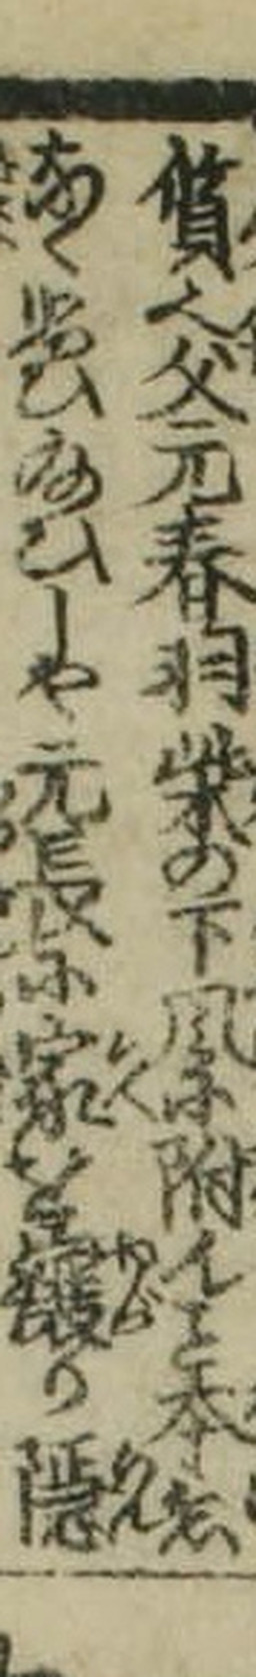なく思ひ給ひしや元長に家を譲り隠
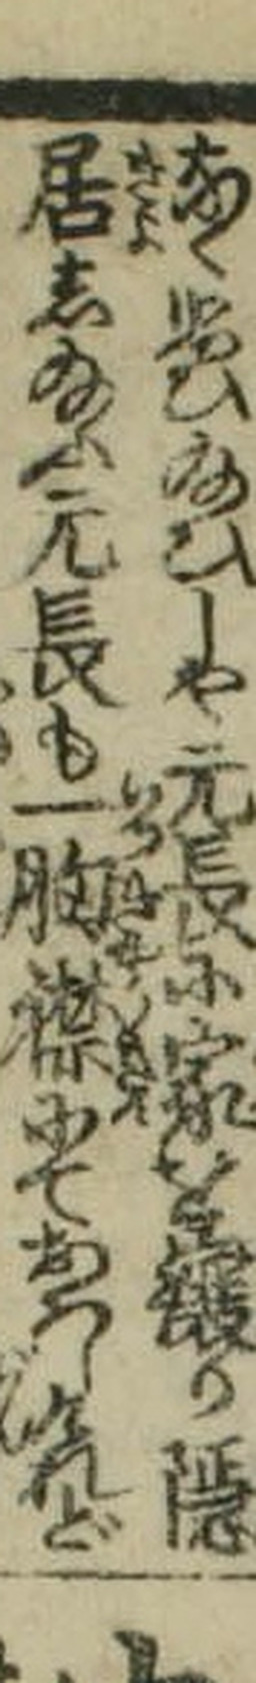居し給ふ元長も一胸襟にておはしけれど
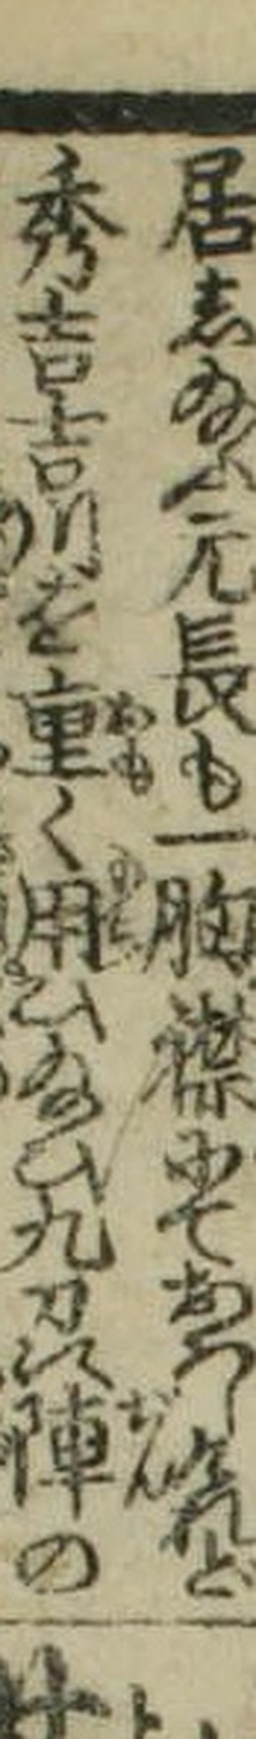秀吉吉川を重く用ひ給ひ九州陣の
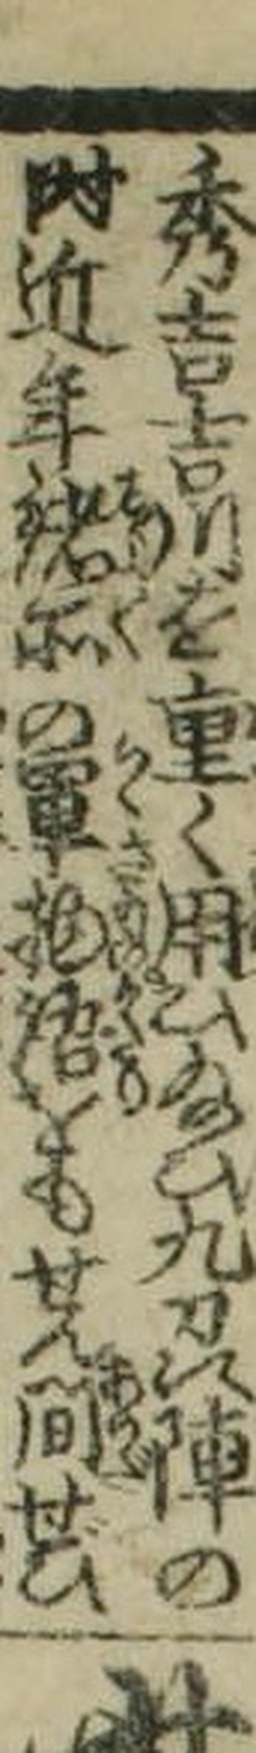時近年諸所の軍物語をもせん間ぜひ
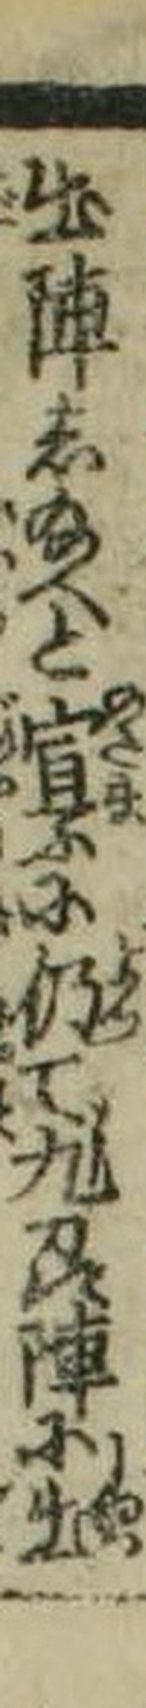出陣し給へと宣ふに仍て九州陣に出
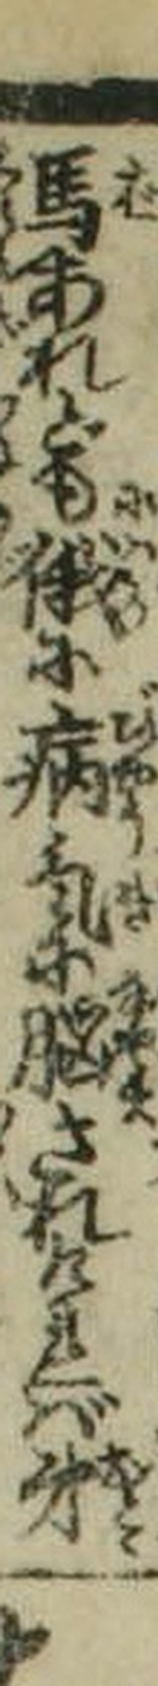馬あれども俄に病気脳されければ弟
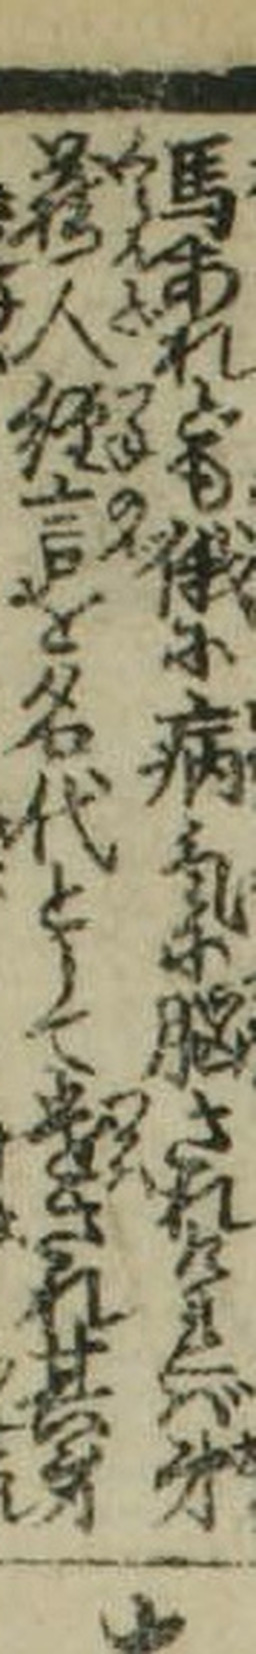蔵人経言を名代として遣され其身
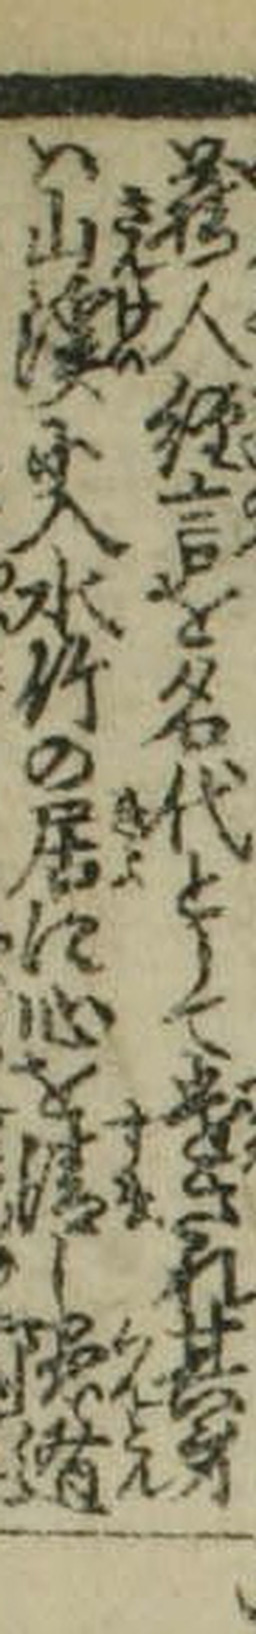は山渓に入水竹の居に心を清し隠遁
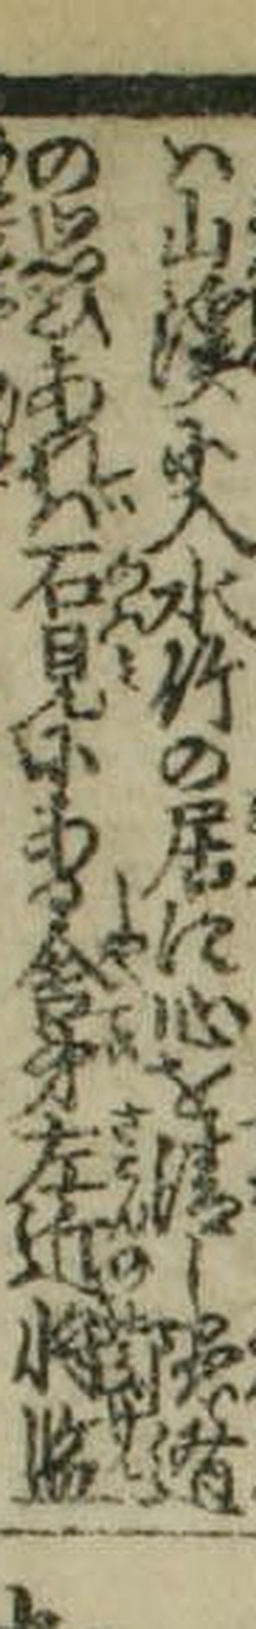の思ひあれば石見にある舎弟左近将監
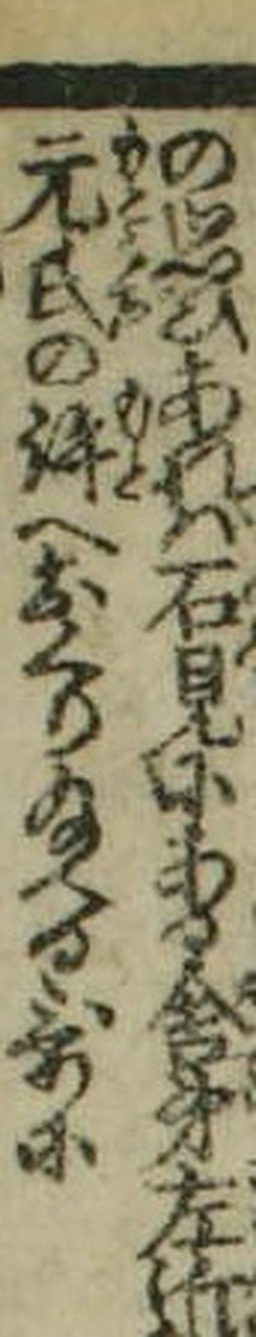元氏の許へおくり給へる哥に
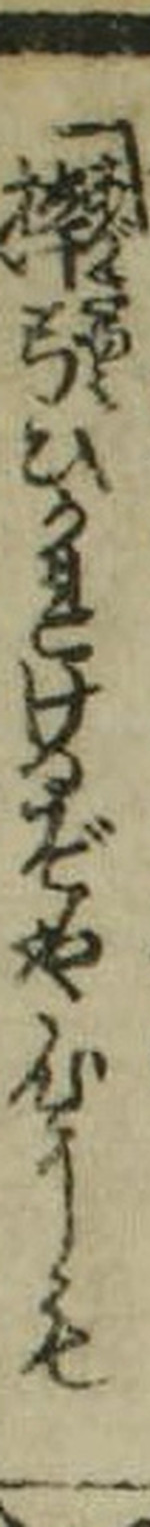〽梓弓ひかれけるぞや心にも
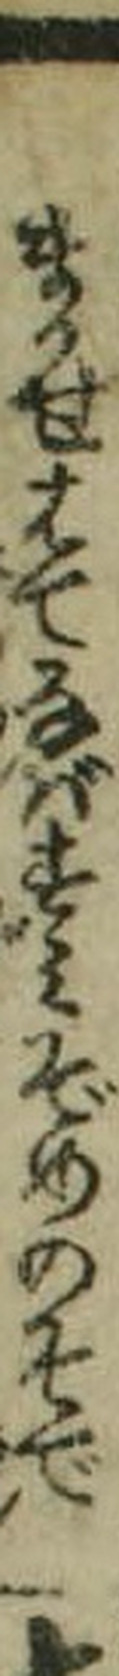まかせはてなばすみぞめのそで
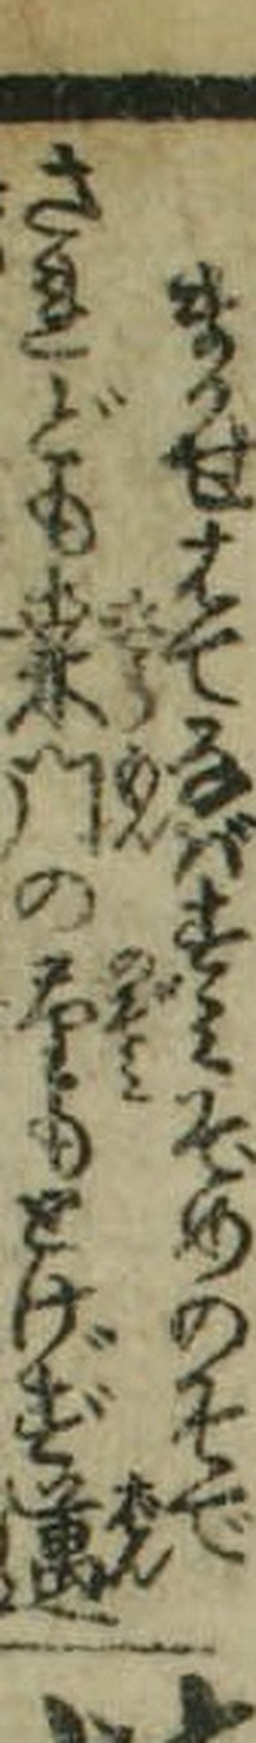されども桑門の望もとけず邁
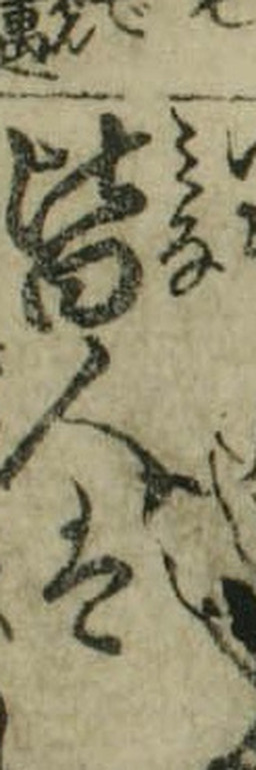皆人は
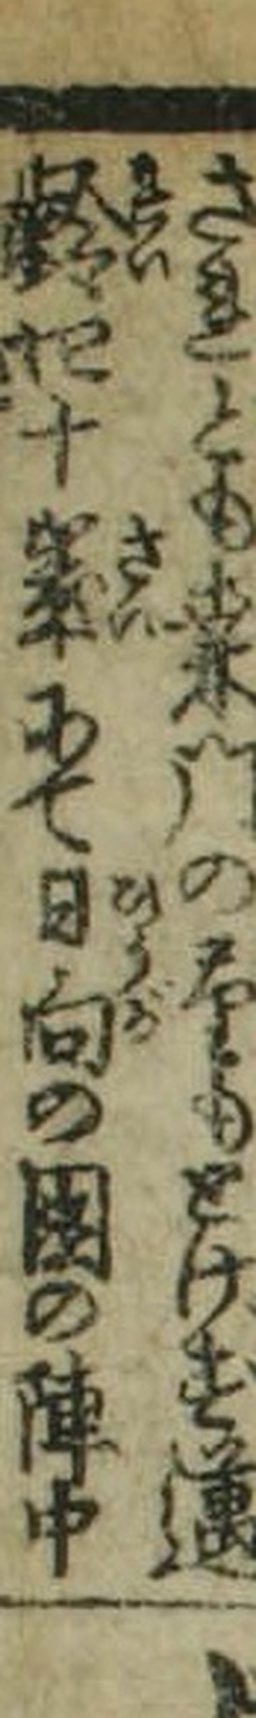齢四十歳にて日向の国の陣中
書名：續英雄百人一首
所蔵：東京学芸大学附属図書館
